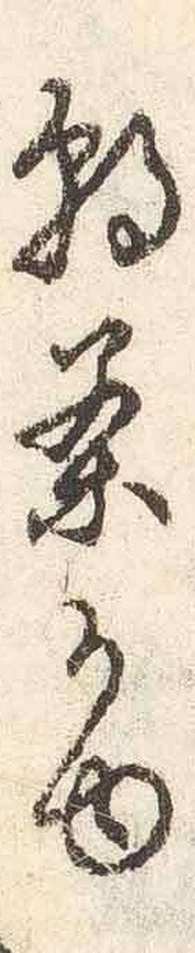朝茶かゆ
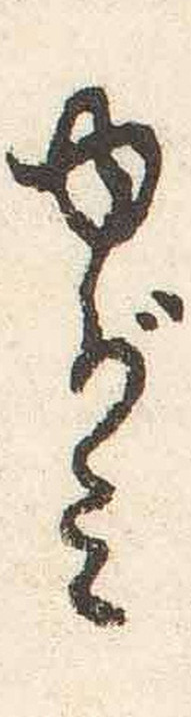ゆがみ
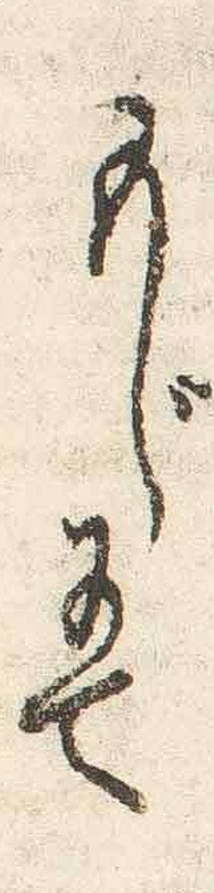もじにて
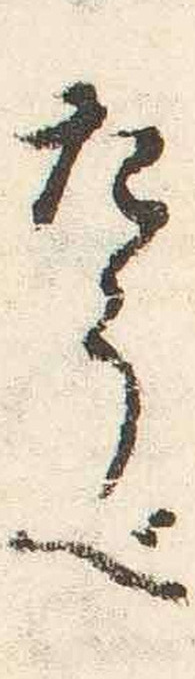たうべ
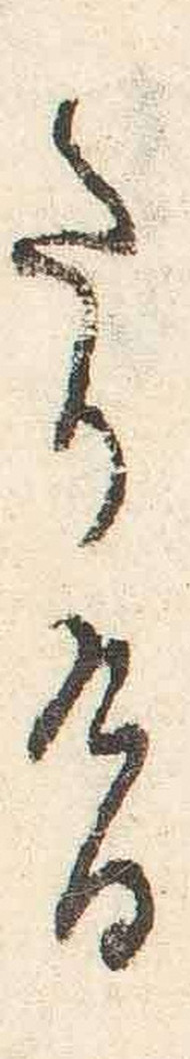たりける

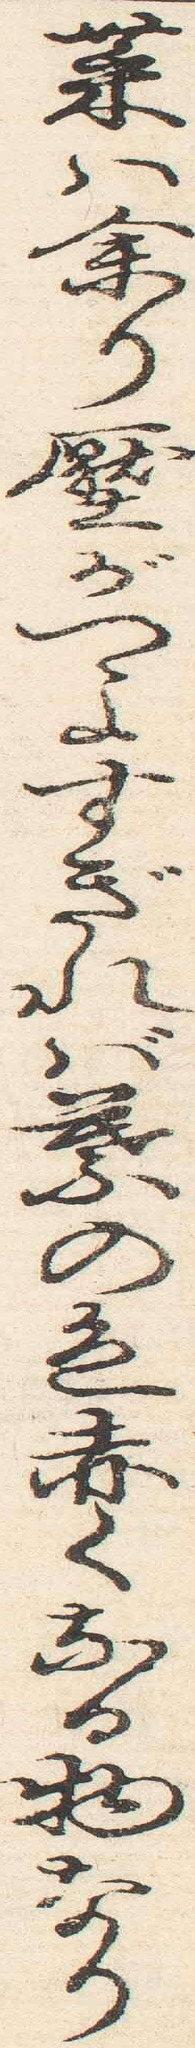菜は余り圧がつよすぎれば葉の色赤くなる物なり
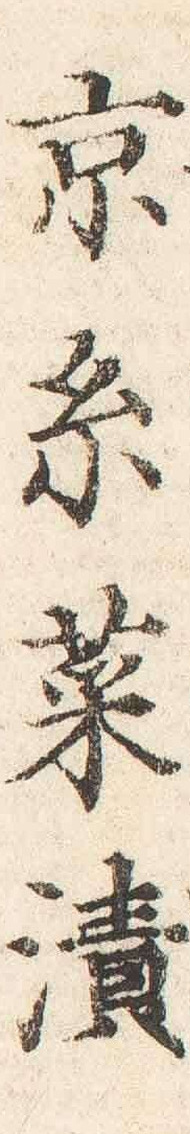京糸菜漬
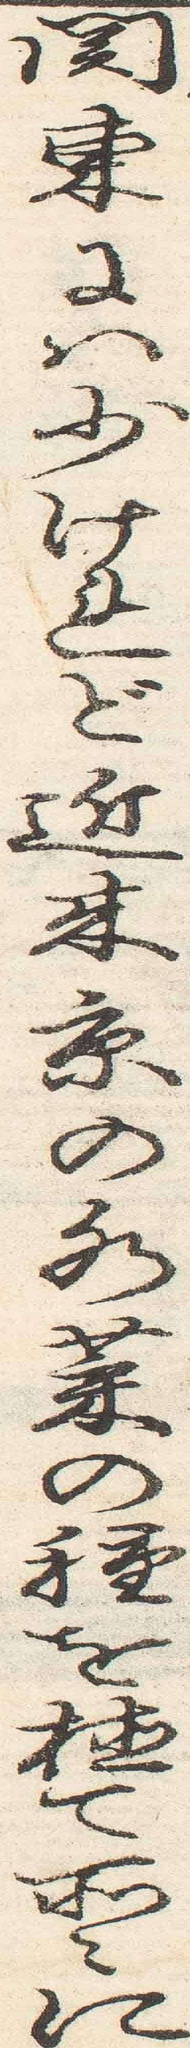関東には少けれど近来京の水菜の種を植て所々に
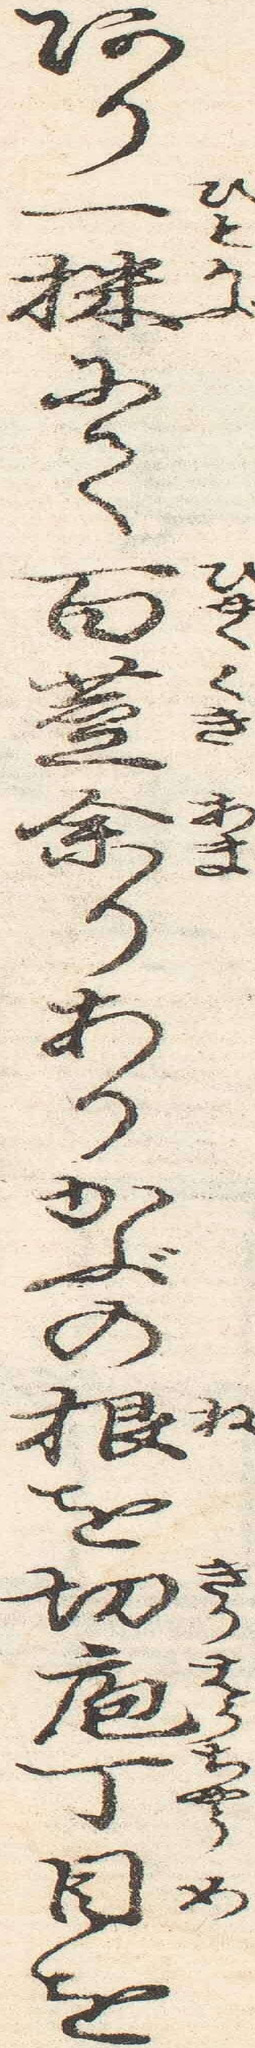あり一株にて百茎余りありかぶの根を切庖丁目を
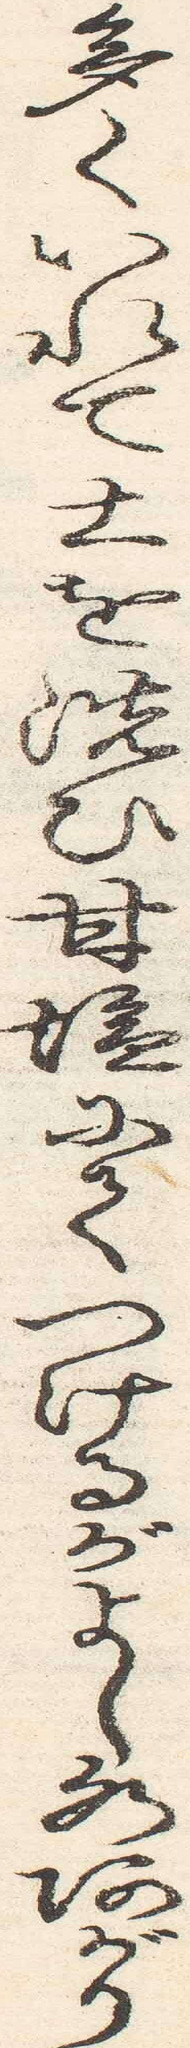多くいれて土を洗ひ甘塩にてつけるがよし水あがり
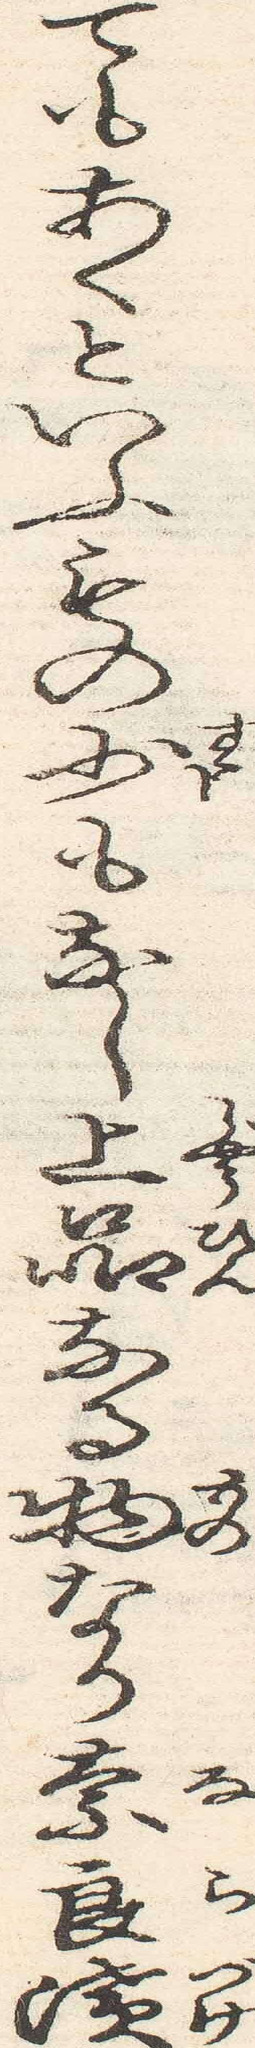てもあくといふもの少もなし上品なる物なり奈良漬
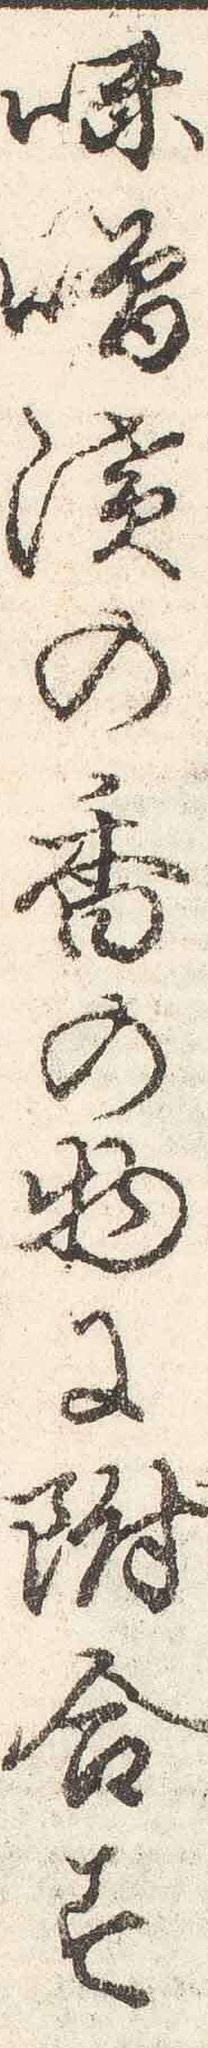味噌漬の香の物に附合す
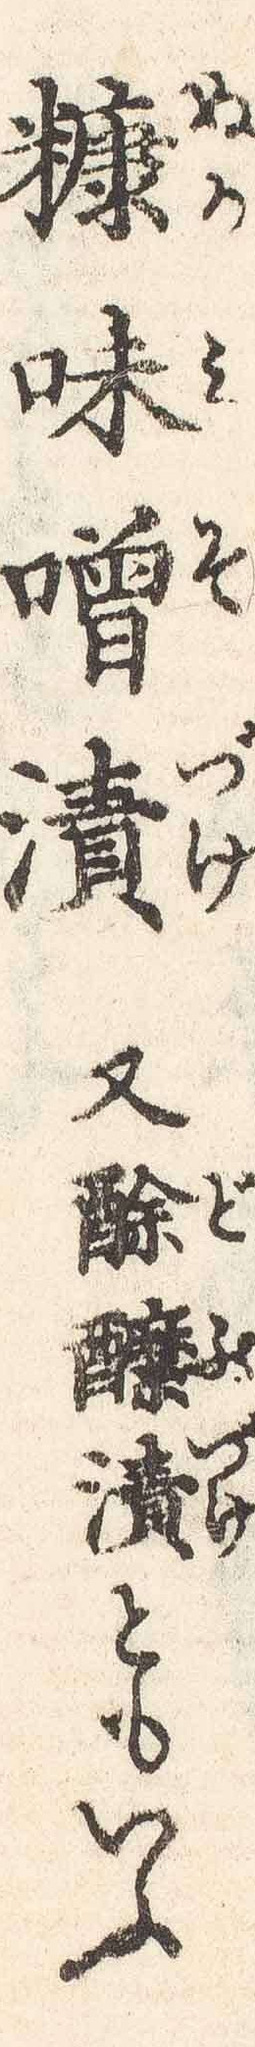糠味噌漬又酴醿漬ともいふ
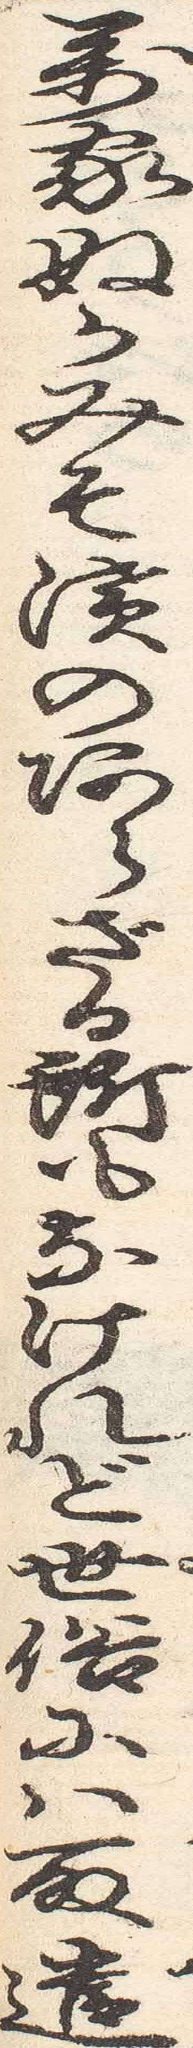万家ぬかみそ漬のあらざる所もなけれど世俗には取遣
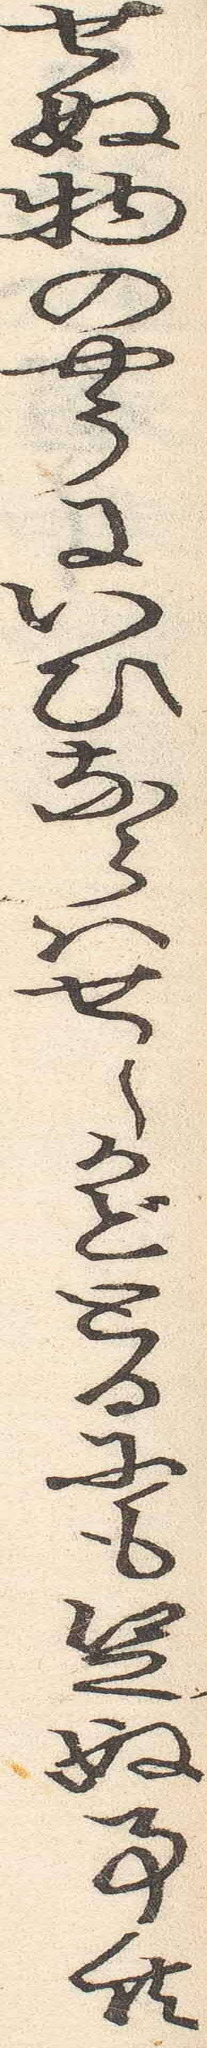せぬ物のやうにいひならはせしかどとるにも足ぬ事共
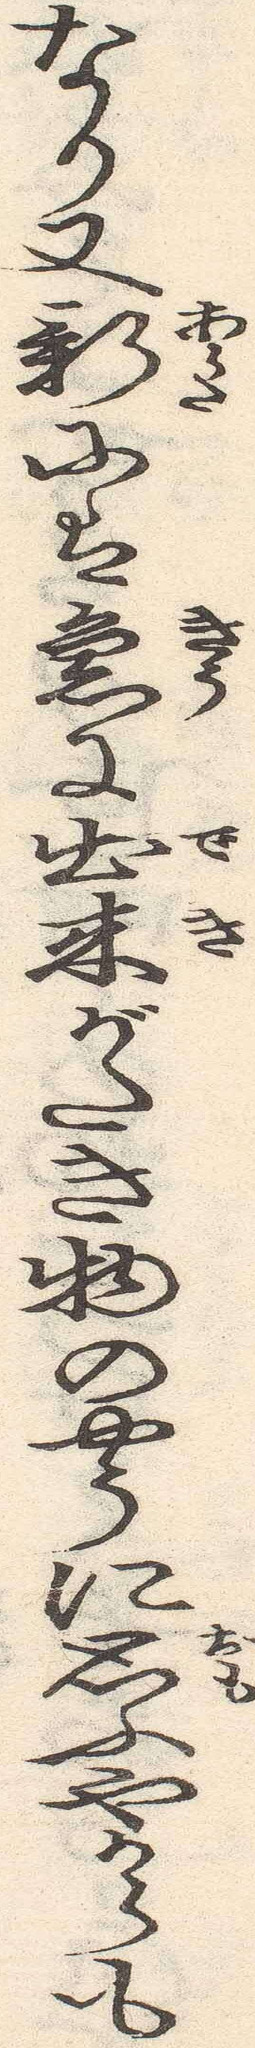なり又新には急に出来がたき物のやうに思ふやからも
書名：四季漬物塩嘉言
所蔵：東京学芸大学附属図書館 国文学研究資料館
